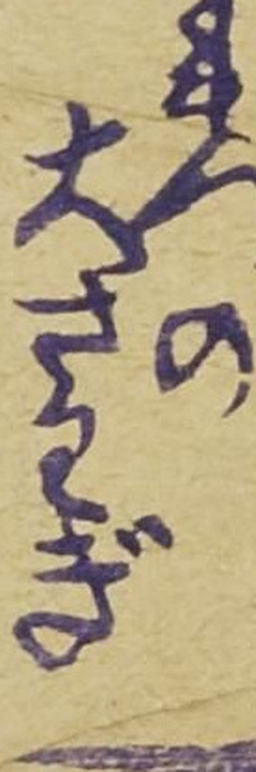大さわぎ
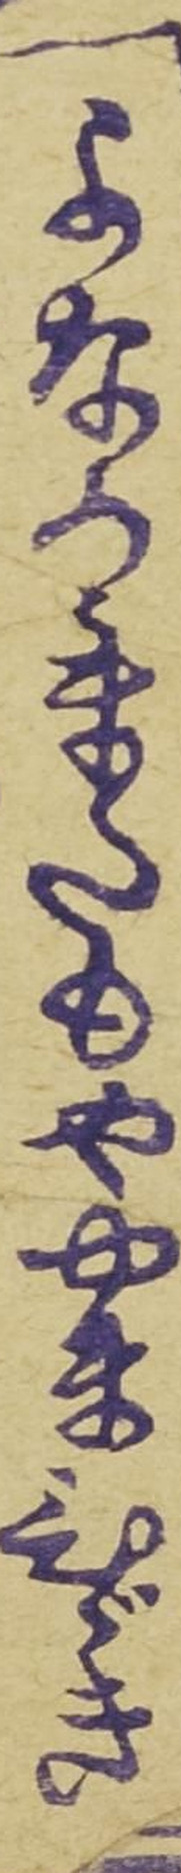〽よなかまたもややまひゞき
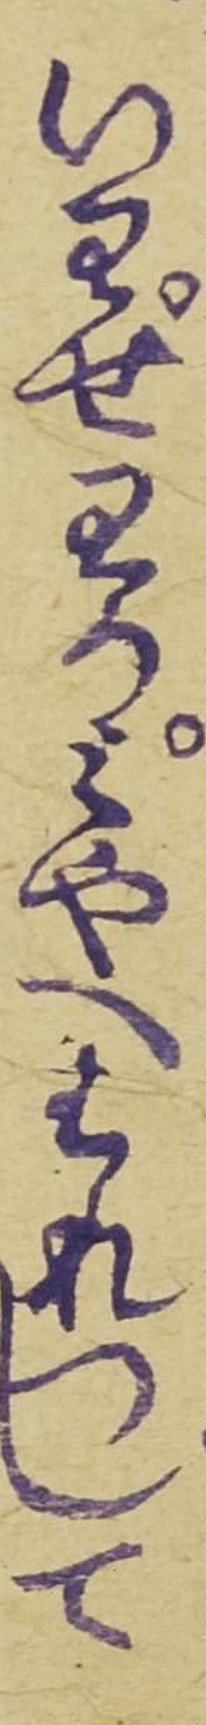いわせわかみやへはれつして
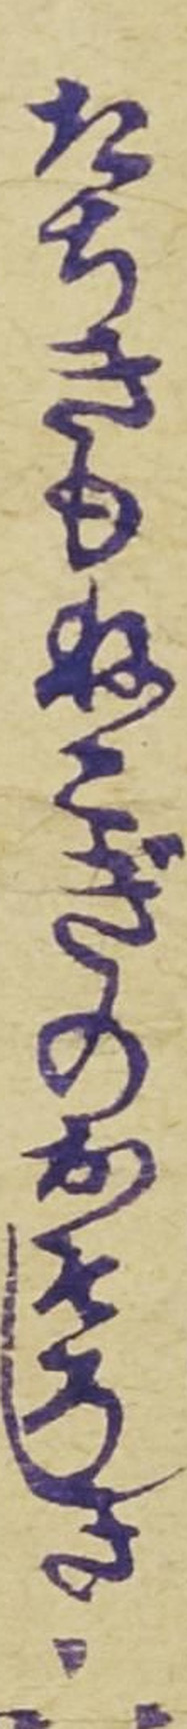たちきもねこぎのおそろしさ
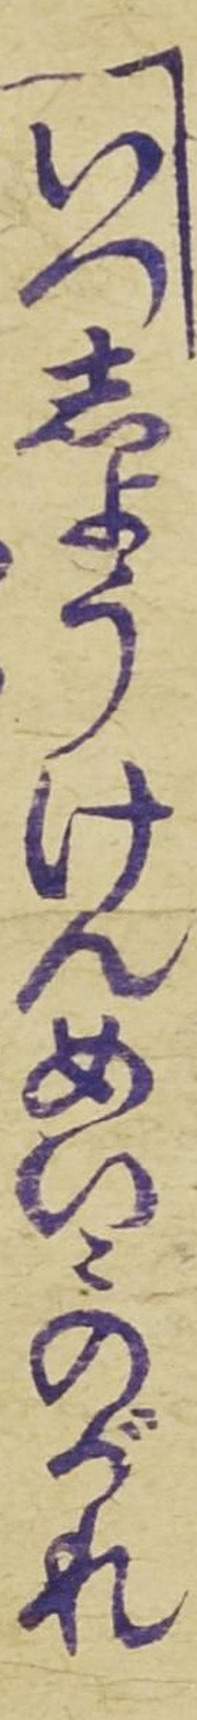〽いつしょうけんめいにのがれ
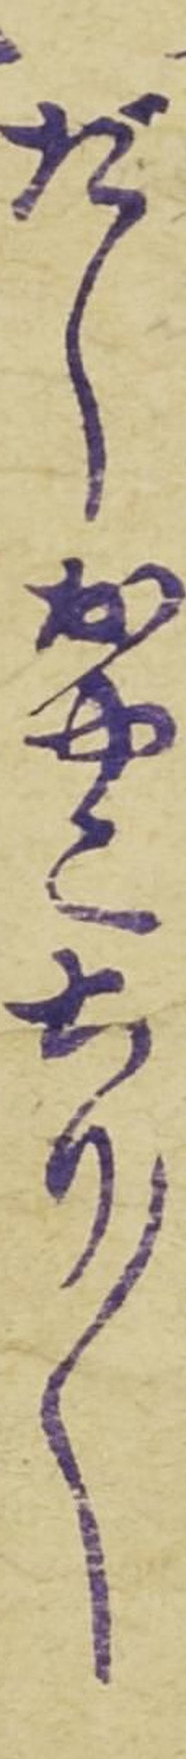だしおやこちり〳〵
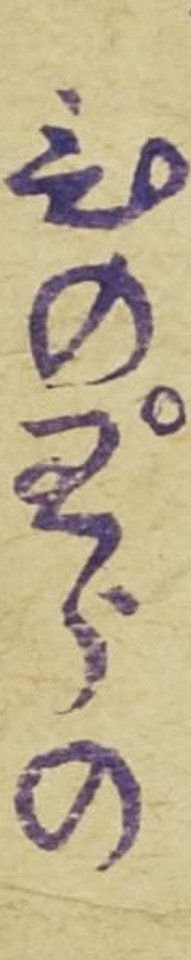ひのわらの
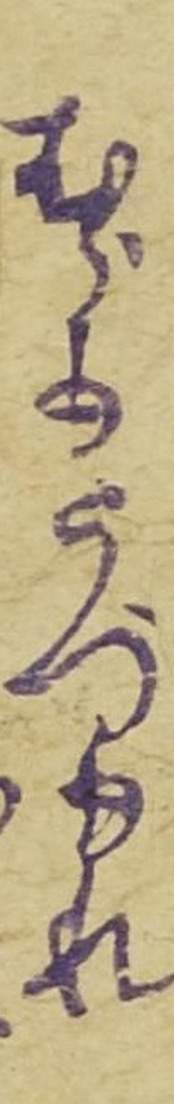むらもうづもれ
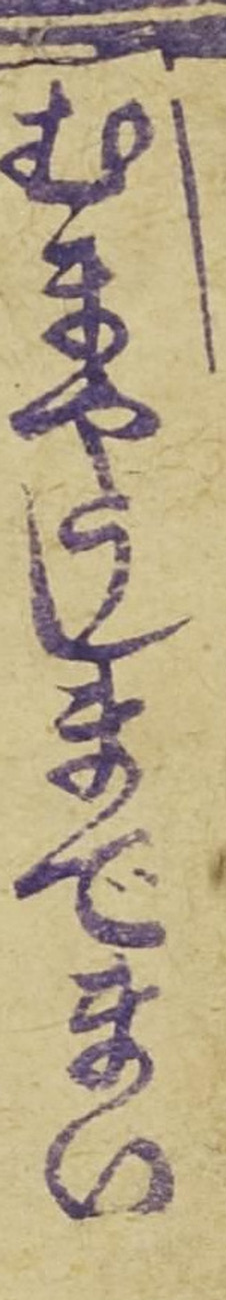〽むまようしまでまい
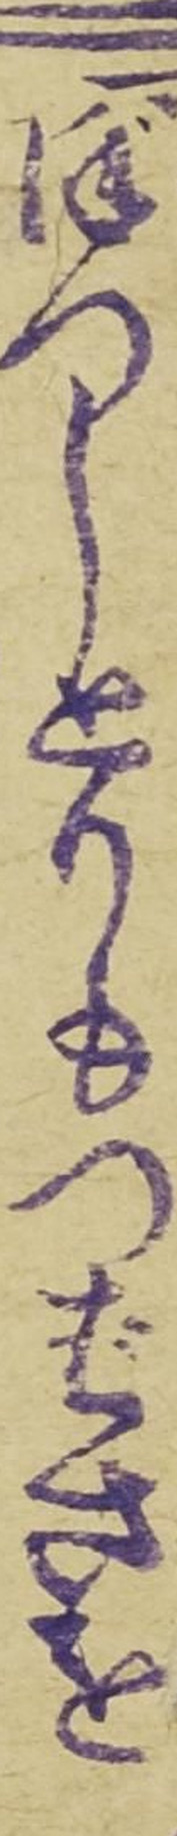ぼつしとりもつばさを
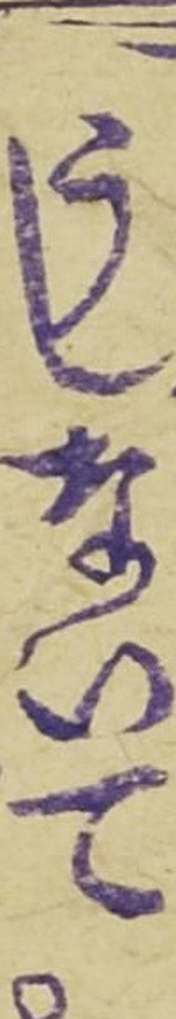うしないて
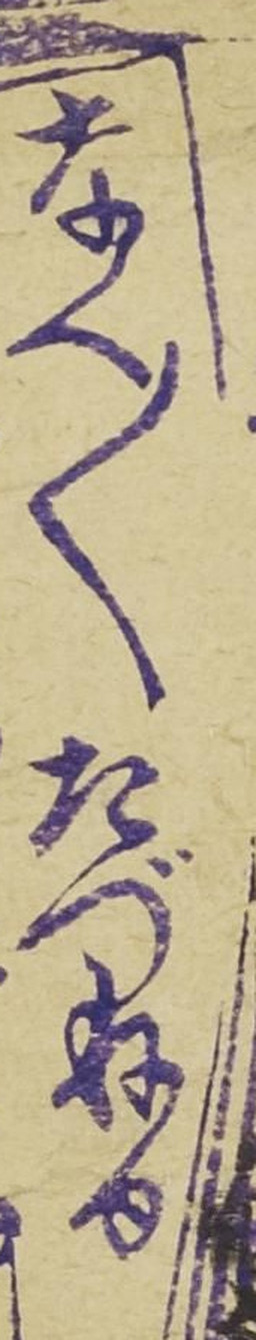〽なく〳〵たづねる
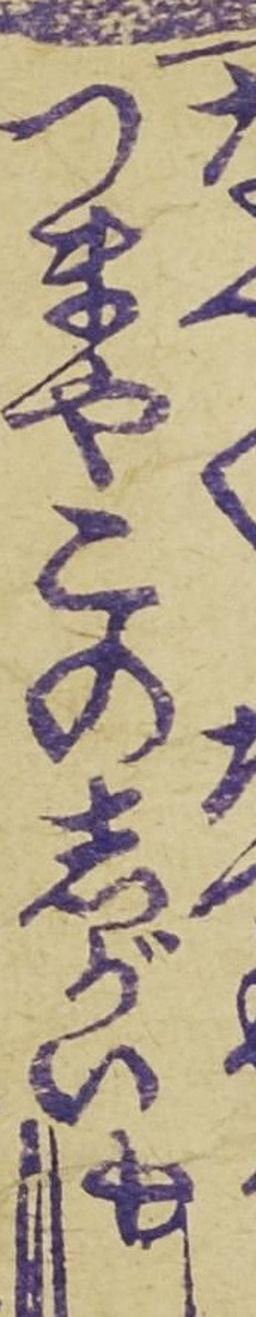つまやこのしがいも
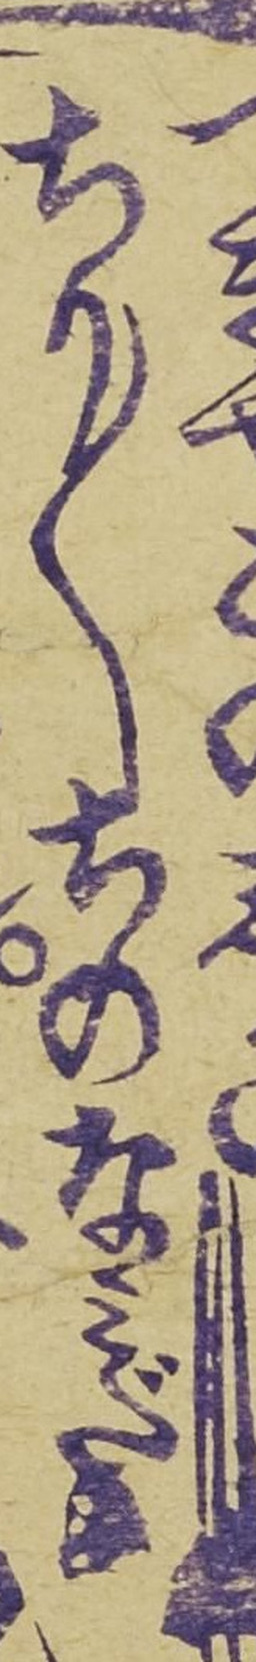ちり〳〵ちのまみだ
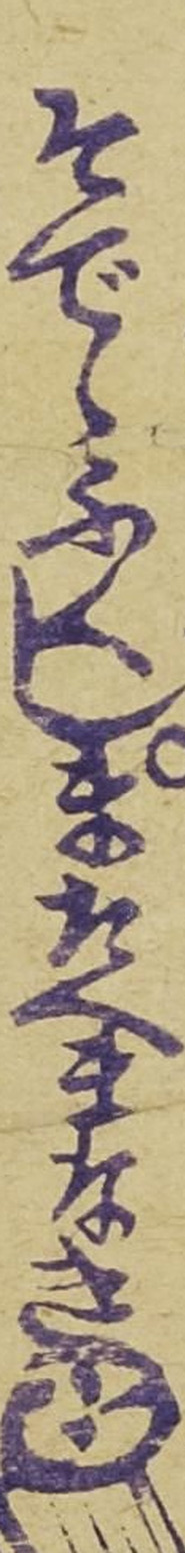そでゝふくしまたへまなき
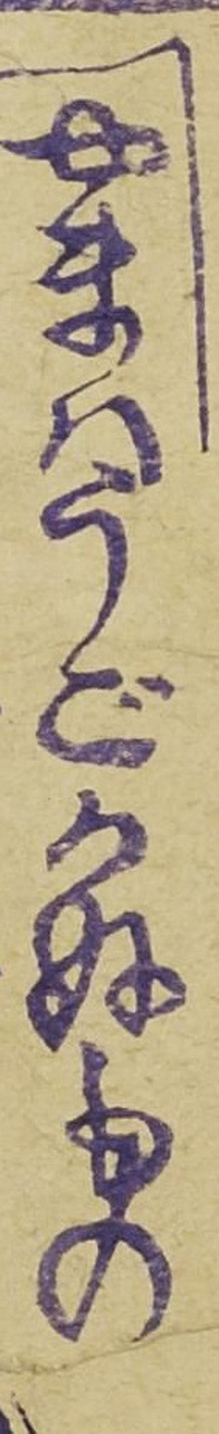〽やまはうごかぬもの
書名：福嶋縣岩代国　ばんだいさん一ツトセぶし
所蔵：東京大学地震研究所図書室 Earthquake Research Institute Library, The University of Tokyo, JAPAN
